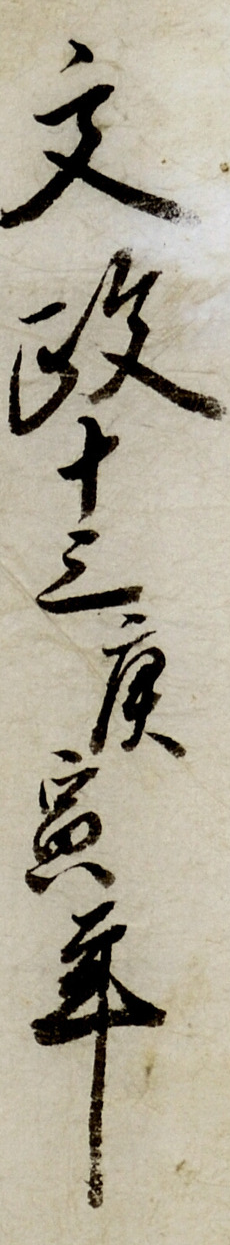文政十三庚寅年
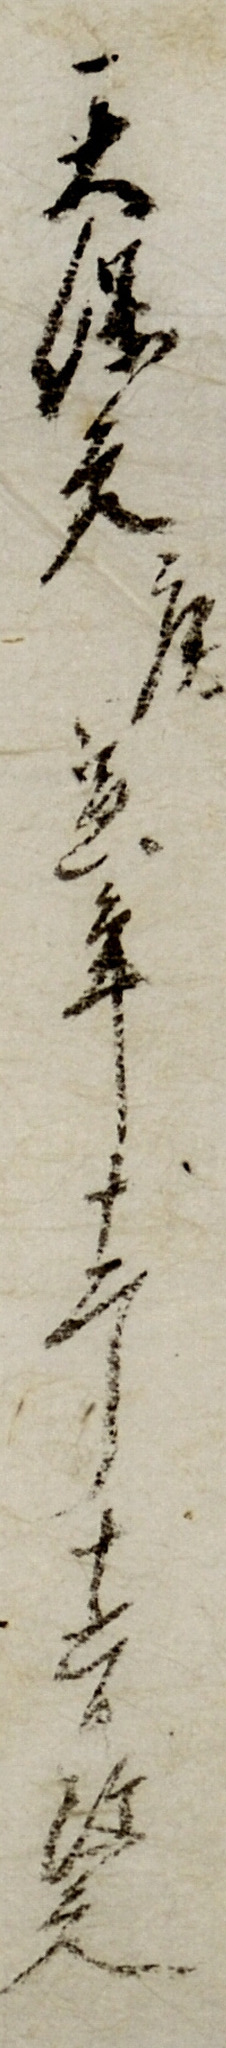天保元庚寅年十二月十六日改元
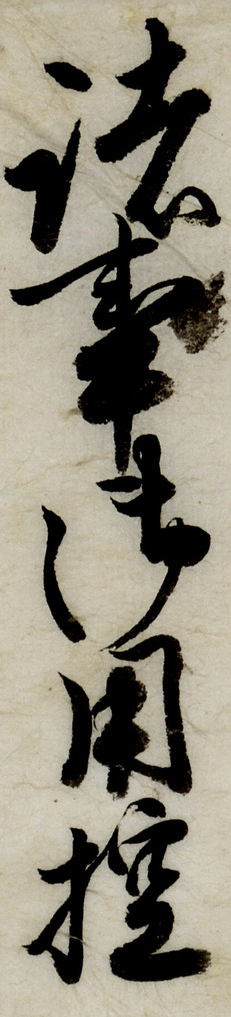諸事御用控
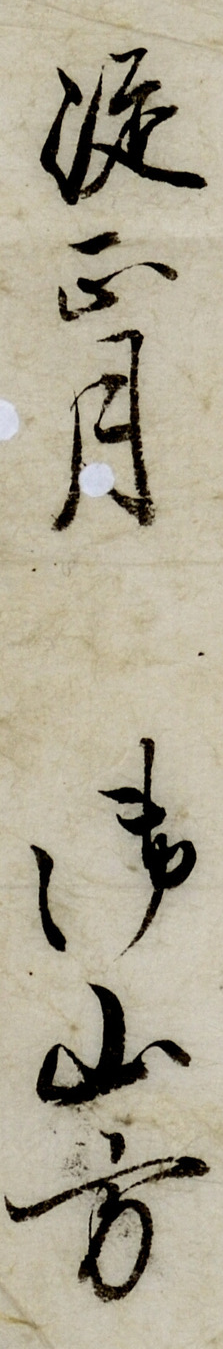従正月御山方

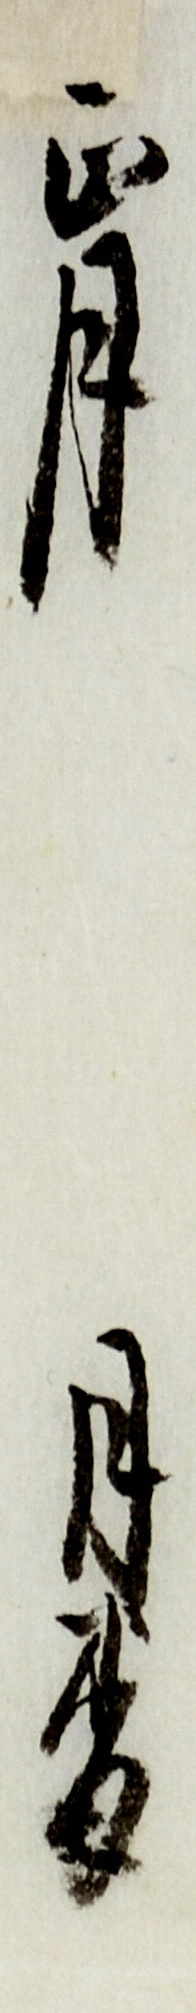正月月番
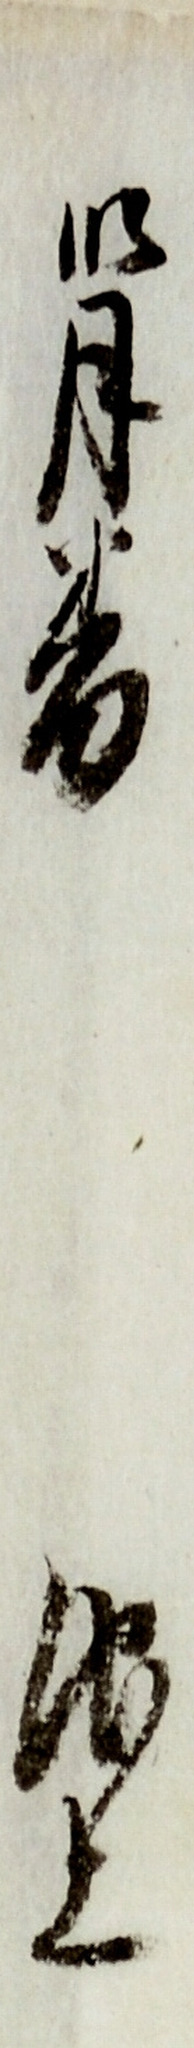御月番池上
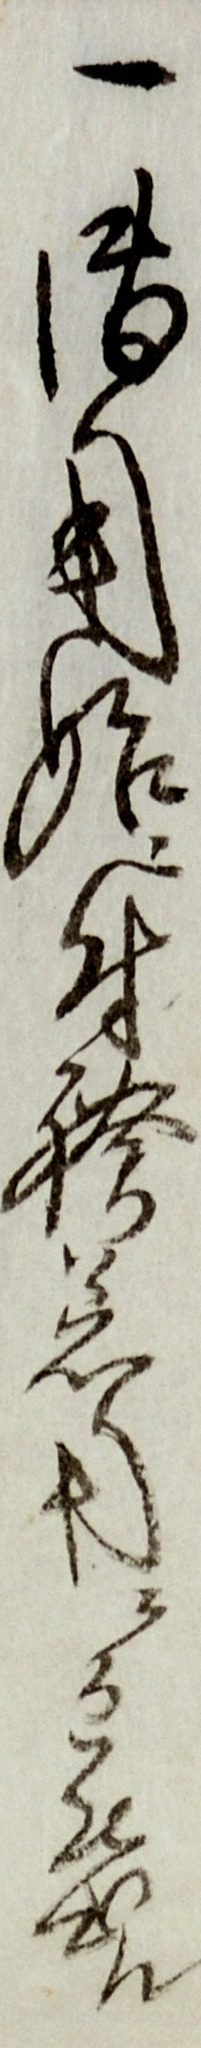一御用始ニ付袴着用ニ而罷出候
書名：諸事御用控
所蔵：伊那市立高遠町図書館・合同会社AMANE
